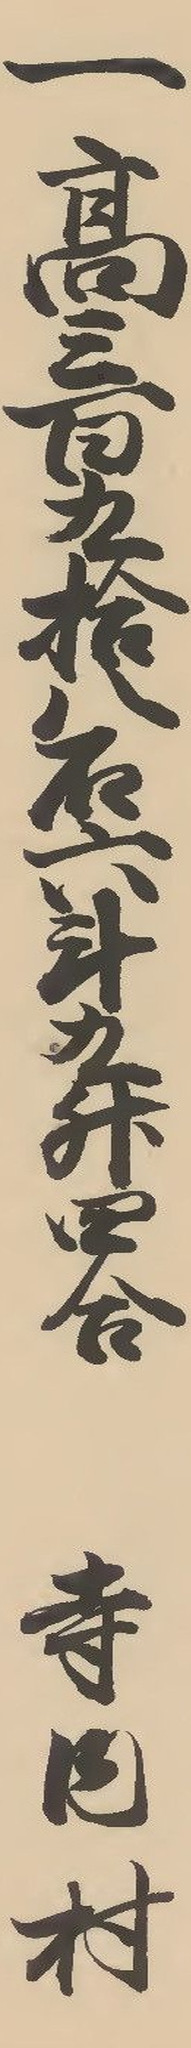一高三百九拾八石六斗九升四合寺内村
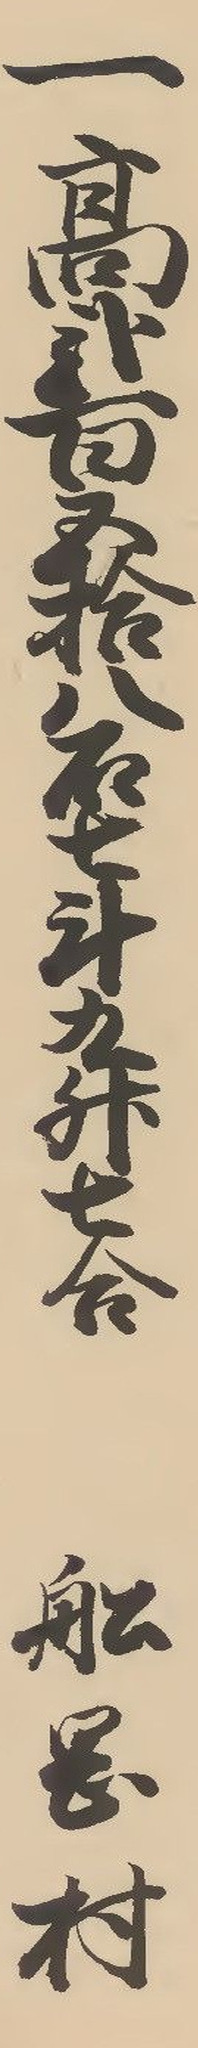一高弐百五拾八石七斗九升七合船岡村
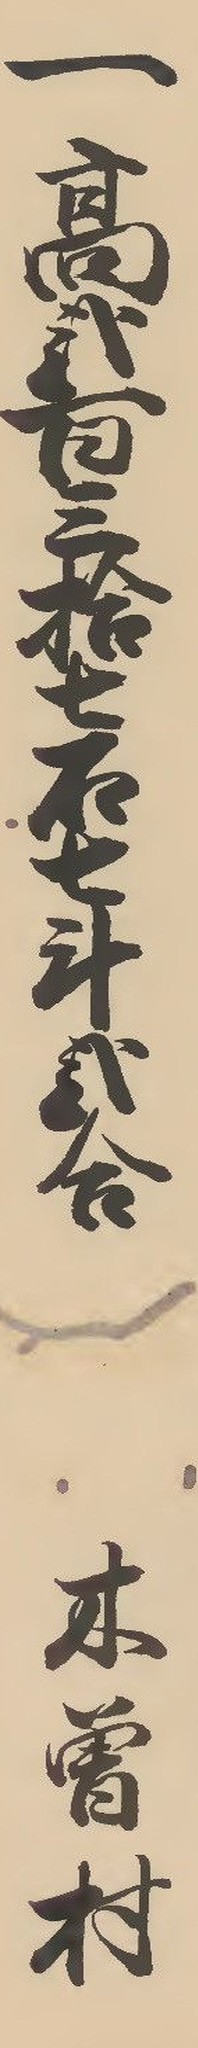一高弐百三拾七石七斗弐合木曽村

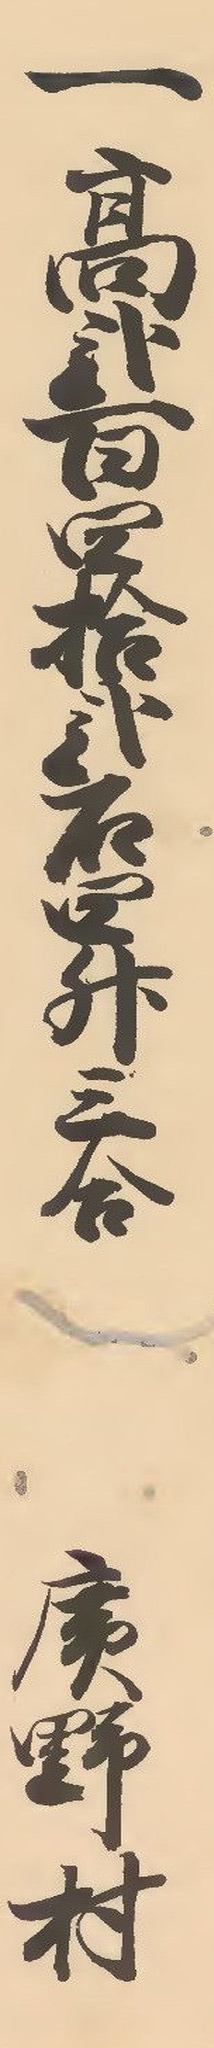一高弐百四拾弐石四升三合広野村
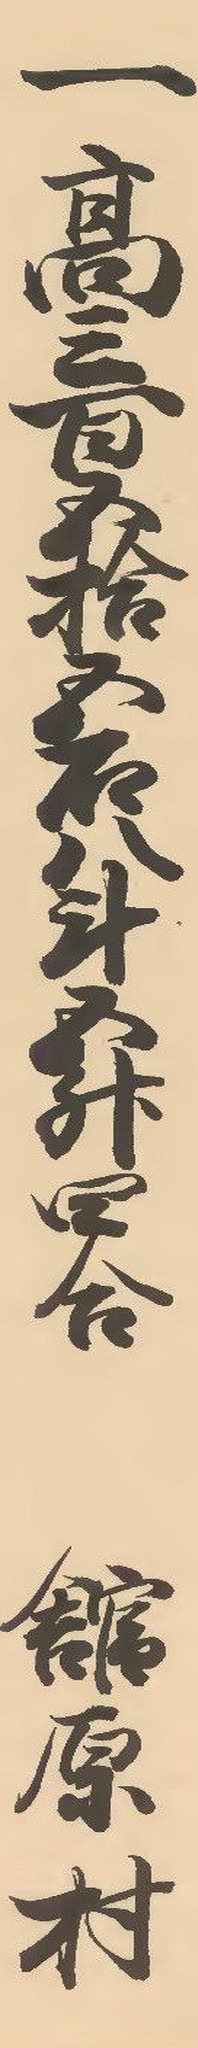一高三百五拾五石八斗五升四合館原村
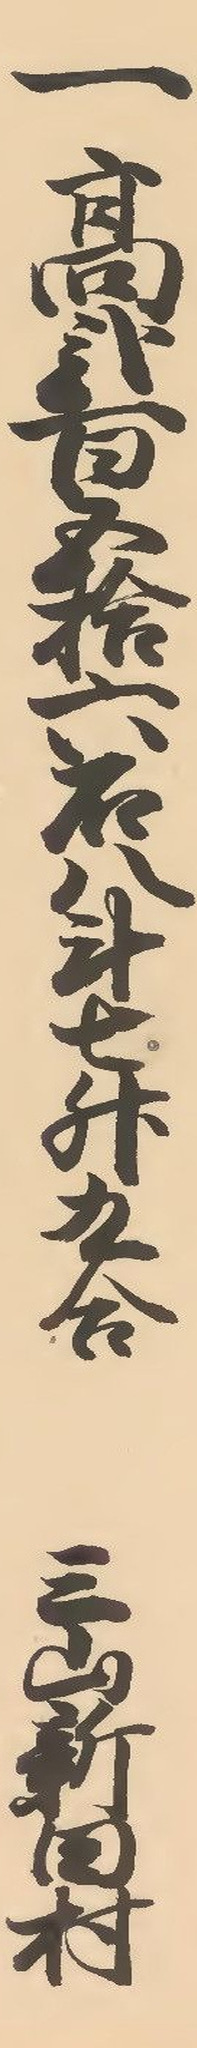一高弐百五拾六石八斗七升九合三山新田村
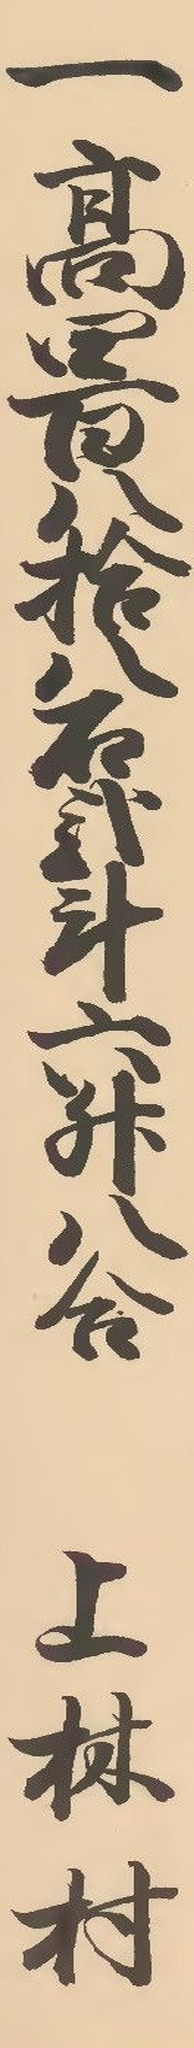一高四百八拾八石弐斗六升八合上林村
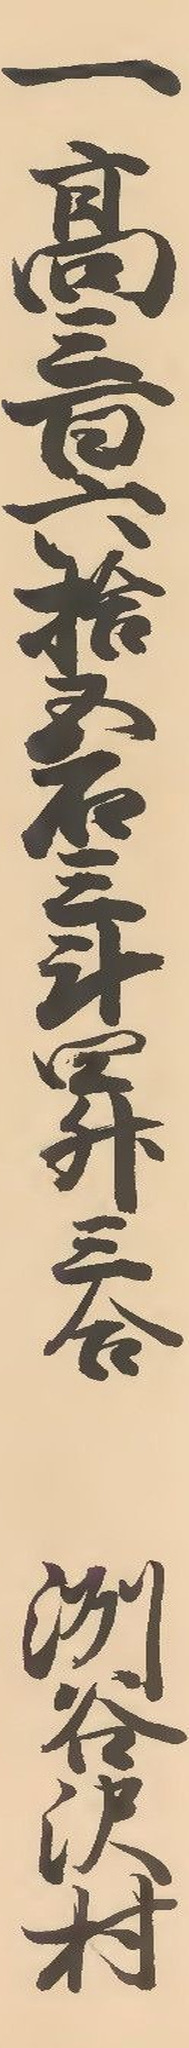一高三百六拾五石三斗四升三合洲谷沢村
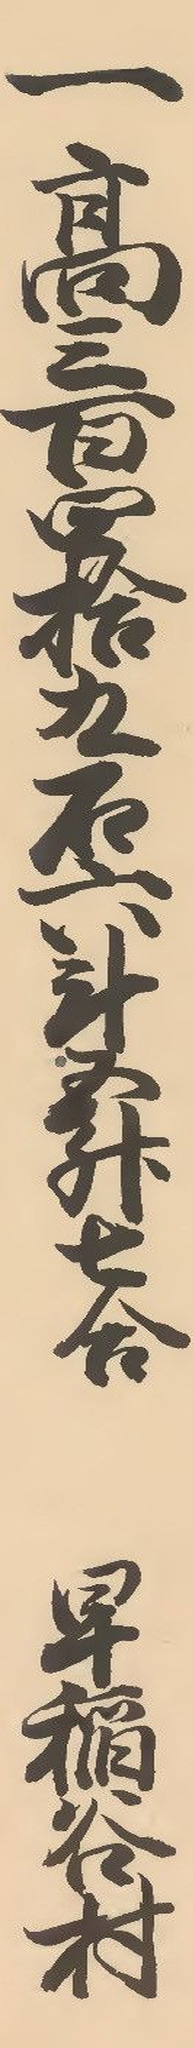一高三百四拾九石六斗五升七合早稲谷村
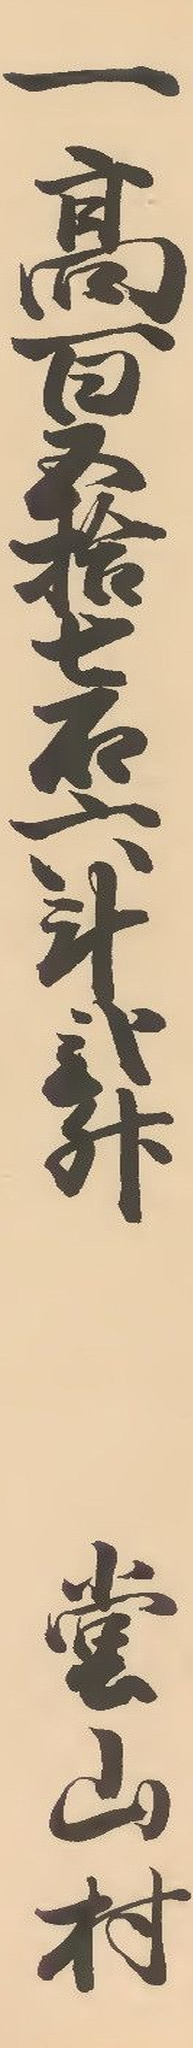一高百五拾七石六斗弐升堂山村
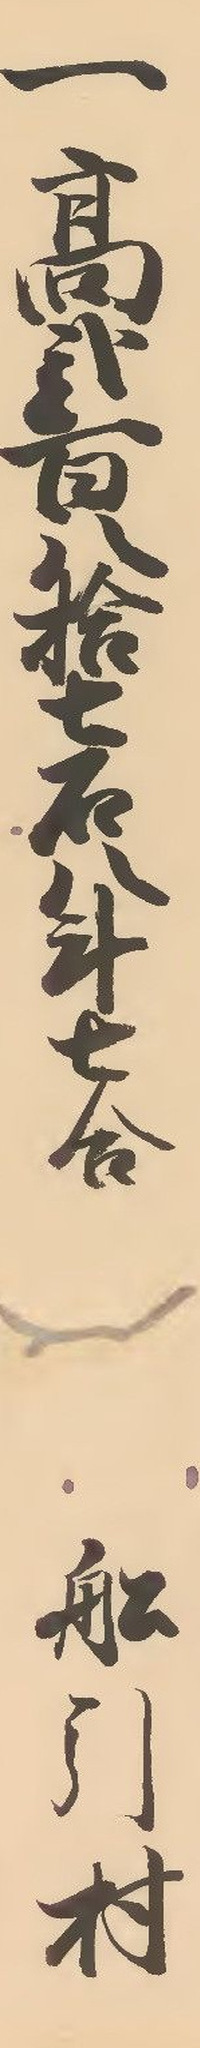一高弐百八拾七石八斗七合船引村

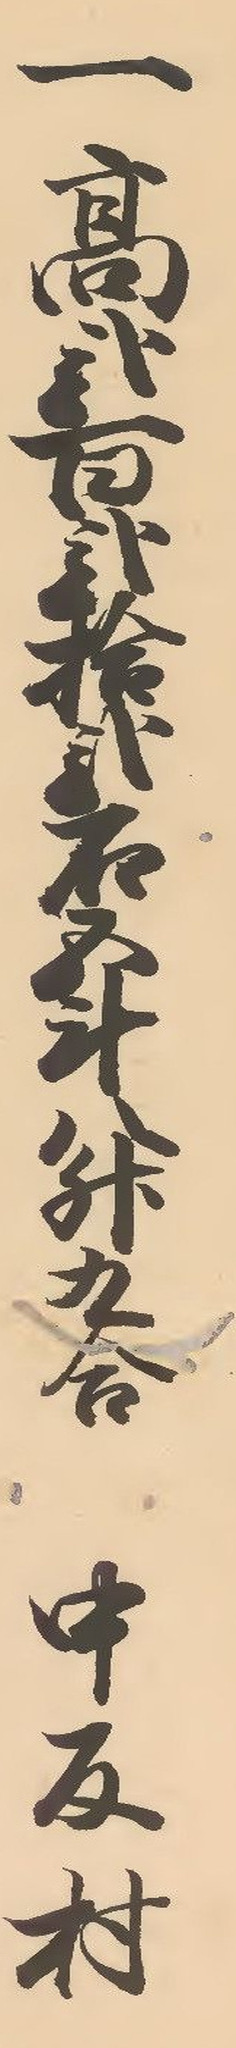一高弐百弐拾弐石五斗八升九合中反村
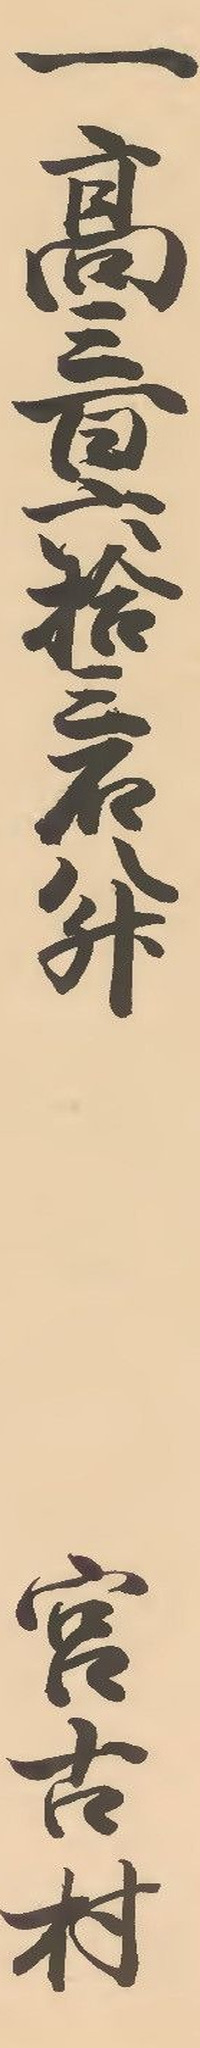一高三百六拾三石八升宮古村
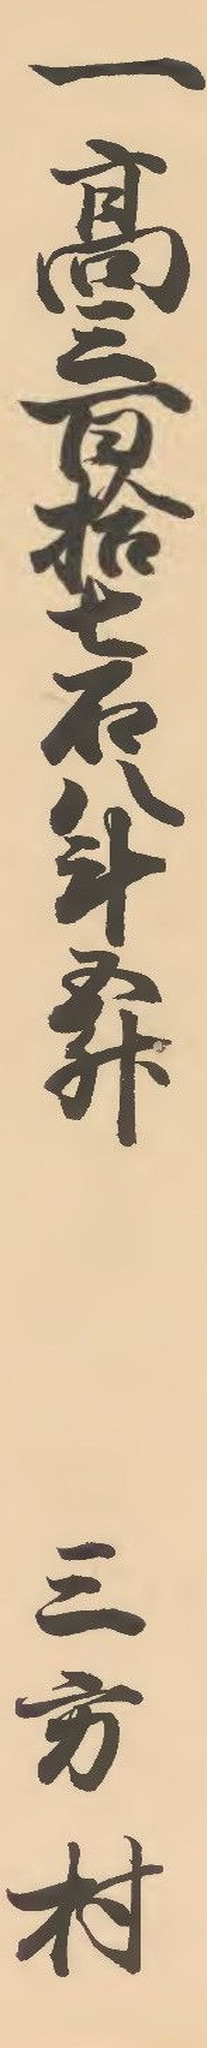一高三百拾七石八斗五升三方村
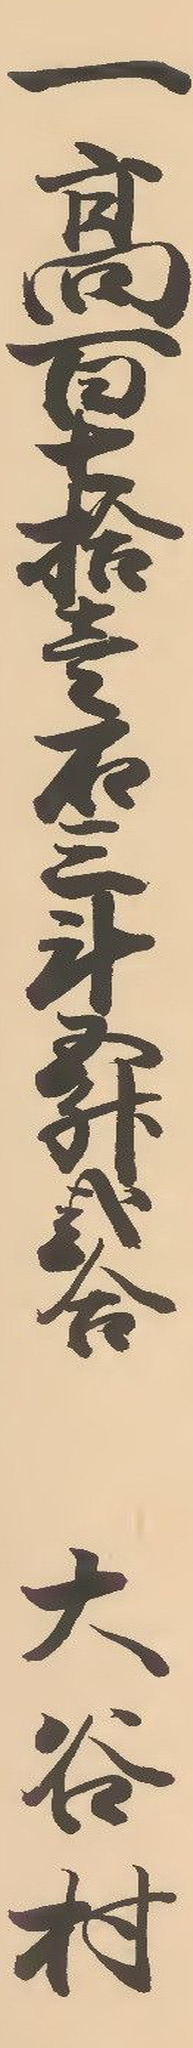一高百七拾壱石三斗五升弐合大谷村
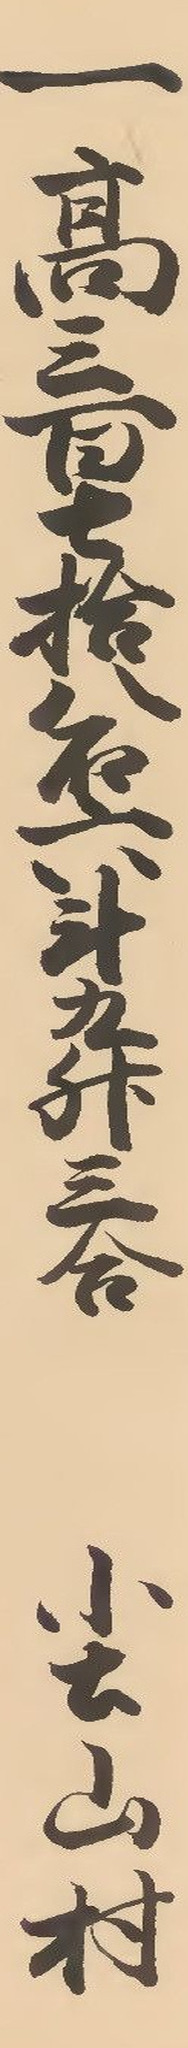一高三百七拾八石六斗九升三合小土山村
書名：陸奥国郷帳　１
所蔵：国立公文書館 National Archives of Japan
